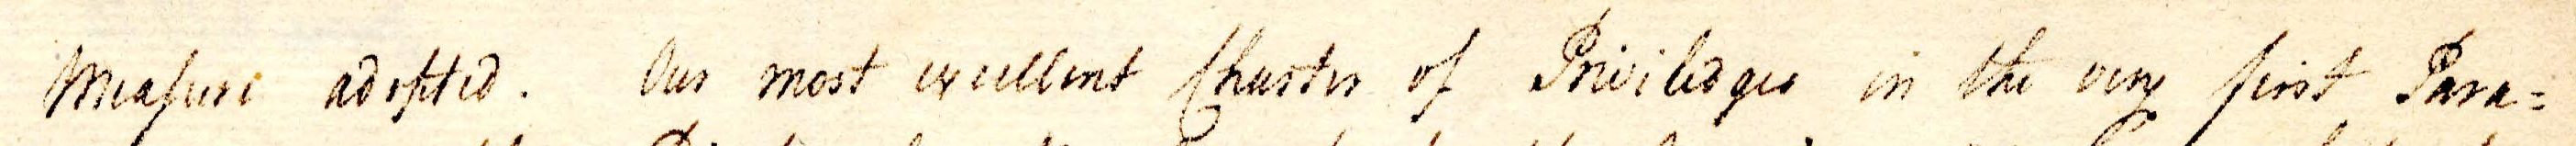Measure adopted. Our most excellent Cluster of Priviledges in the very first Para-
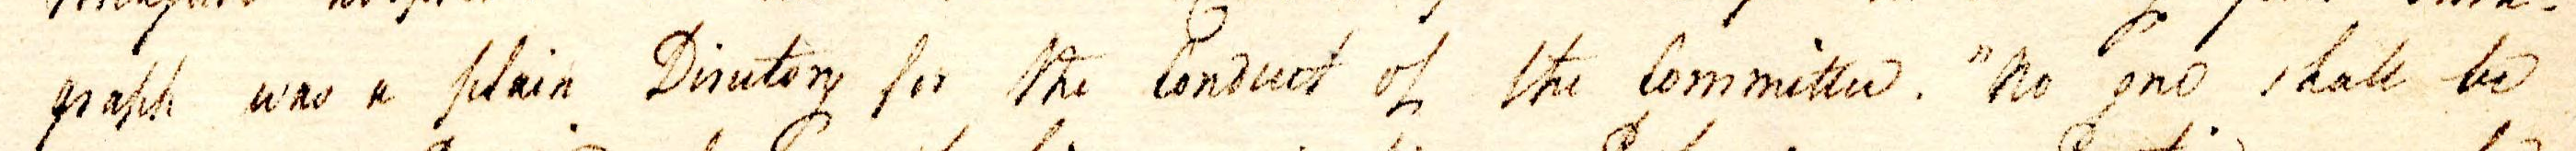graph was a plain Directory for the Conduct of the Committee. "No one shall be
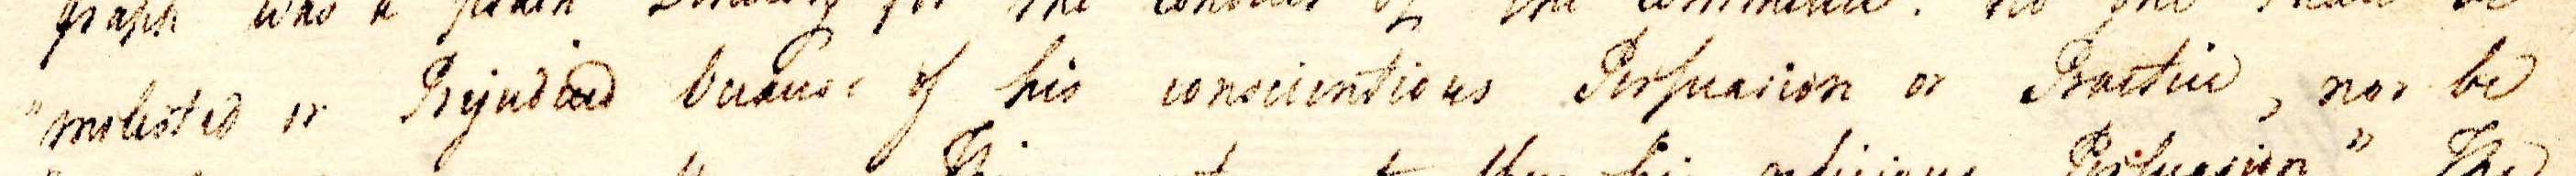"molested or Prejudiced because of his conscientious Persuasion or Practice, nor be
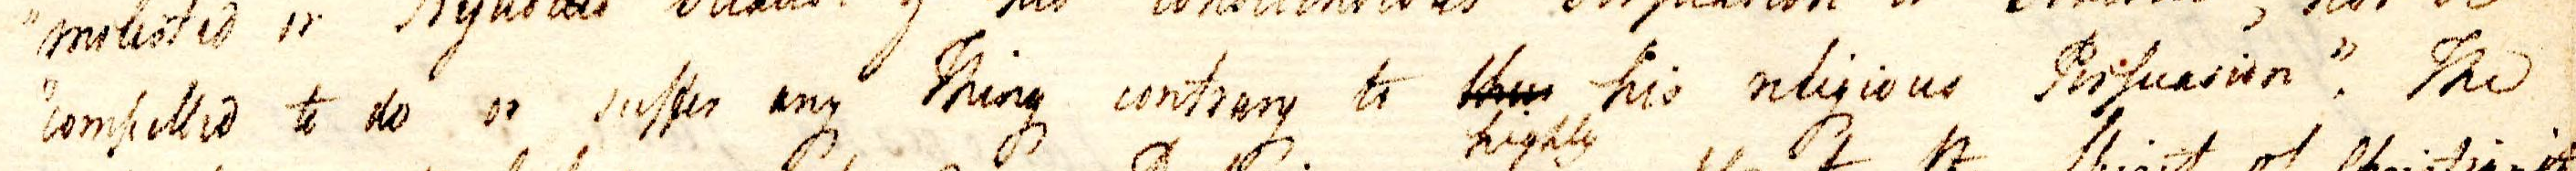"compelled to do or suffer any Thing contrary to their his religious Persuasion." The
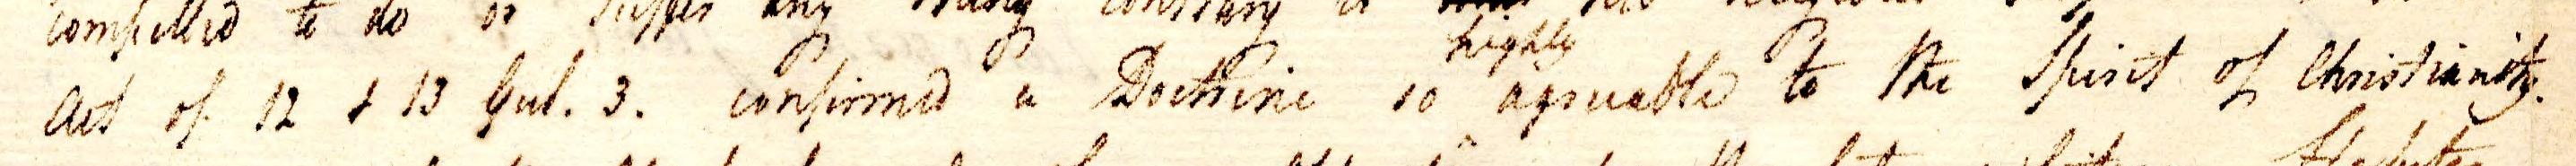Art of 12 & 13 Gul. 3. confirmed a Doctrine so ^ agreeable to the Spirit of Christianity.
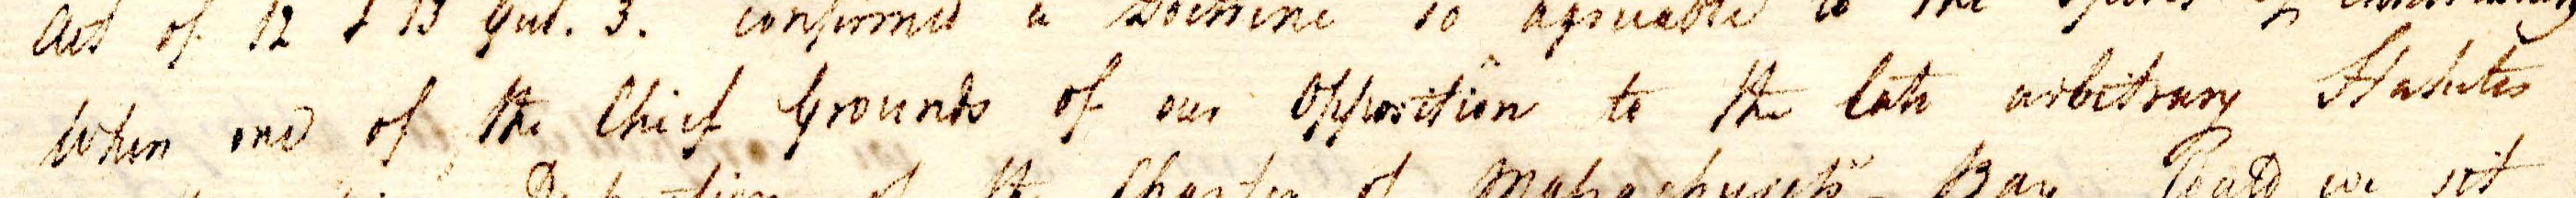When one of the Chief Grounds of our Opposition to the late arbitrary statutes
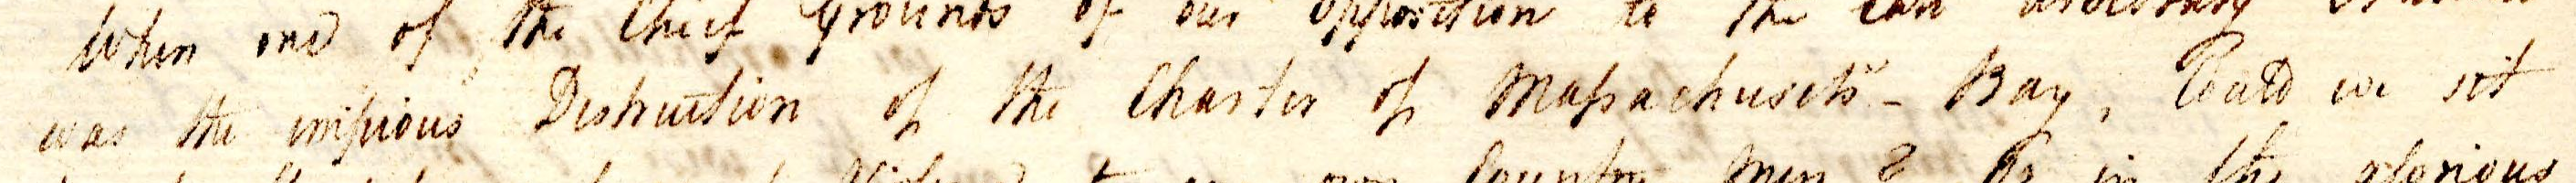was the impious Destruction of the Charter of Massachusetts Bay, Could we sit
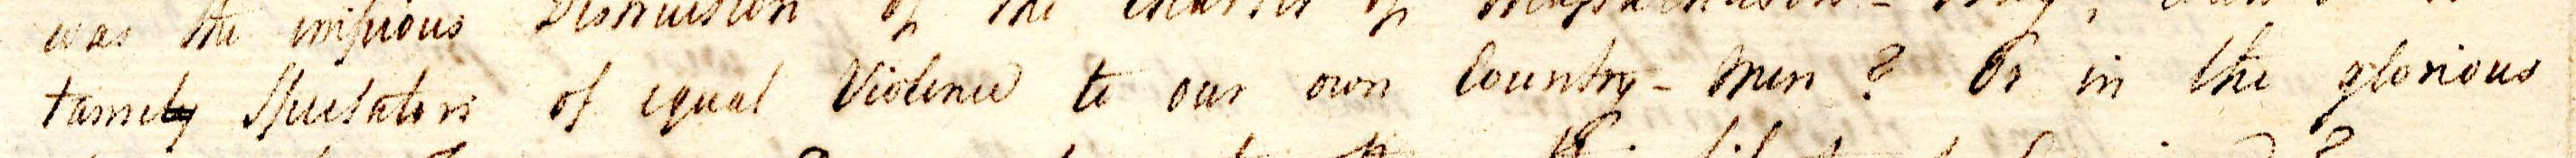tamely Spctators of equal Violence to our own Country-men? Or in the glorious
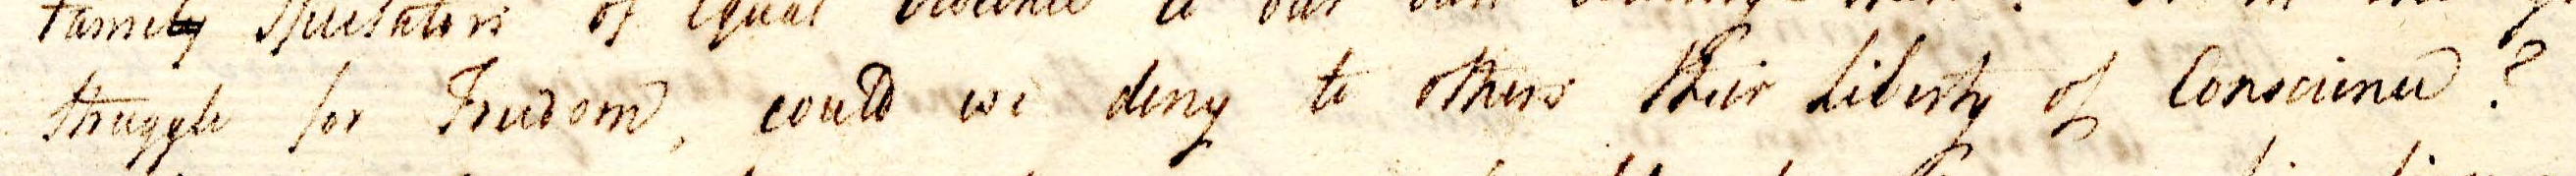Struggle for Freedom could we deny to others their Liberty of Conscience?
